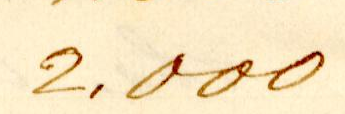2,000
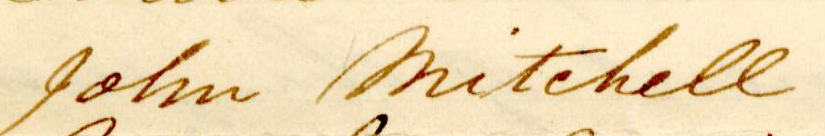John Mitchell
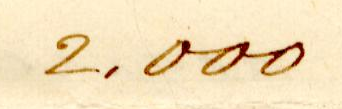2,000
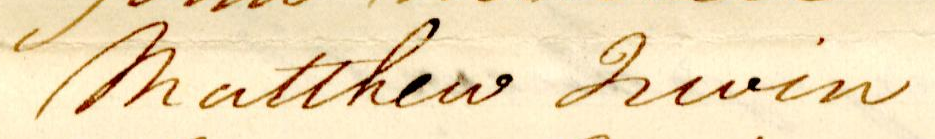Matthew Irvin
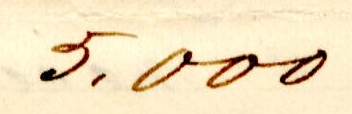5,000
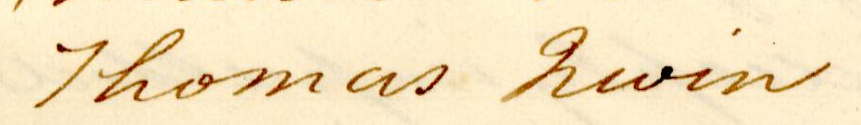Thomas Irwin
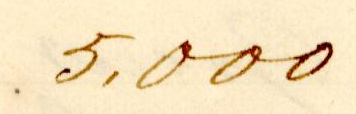5,000
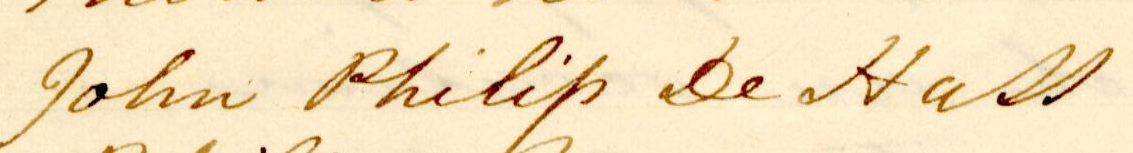John Philip De Hall
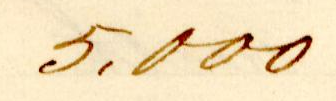5,000
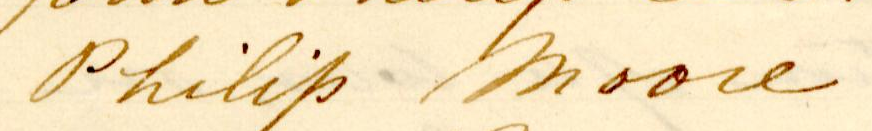Philip Moore
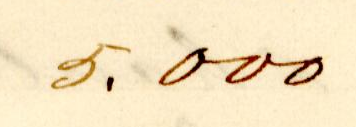5,000
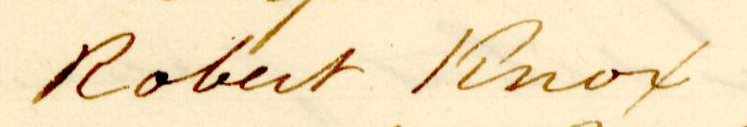Robert Knox
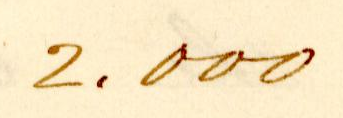2,000
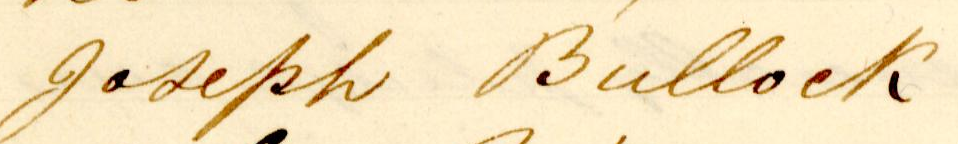Joseph Bullock
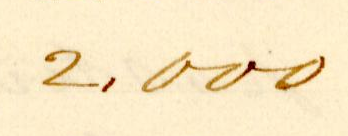2,000
